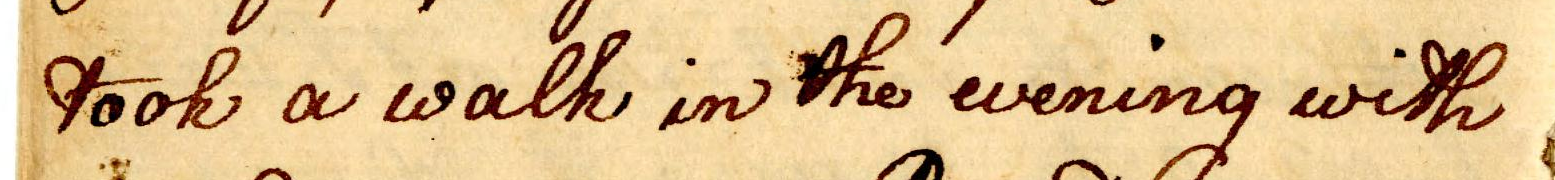took a walk in the evening with
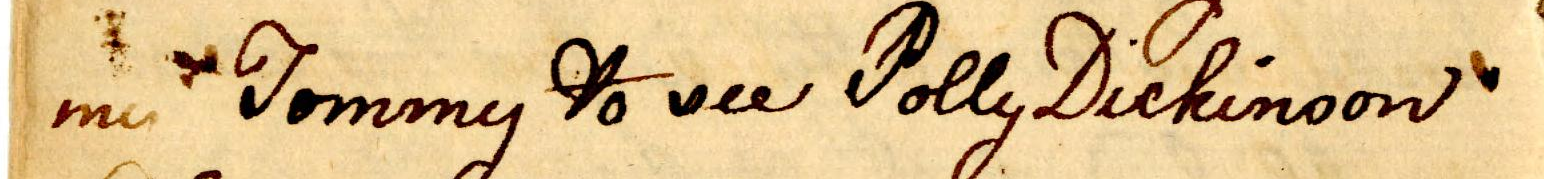my Tommy to se Polly Dickinson
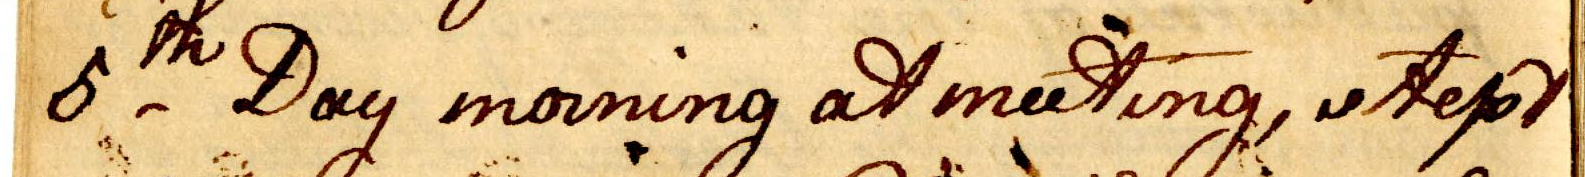5^th Day morning at meeting, stept
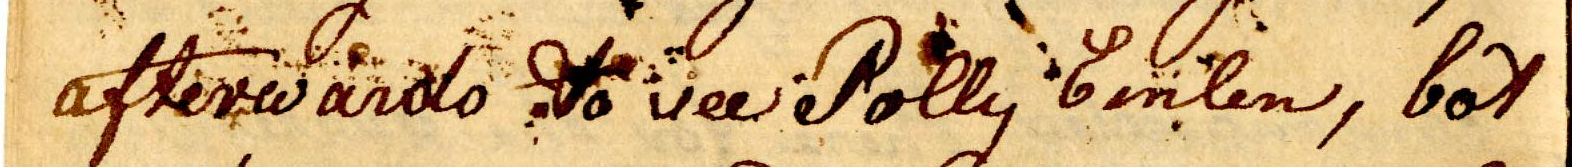afterwards to see Polly Emlen, bot
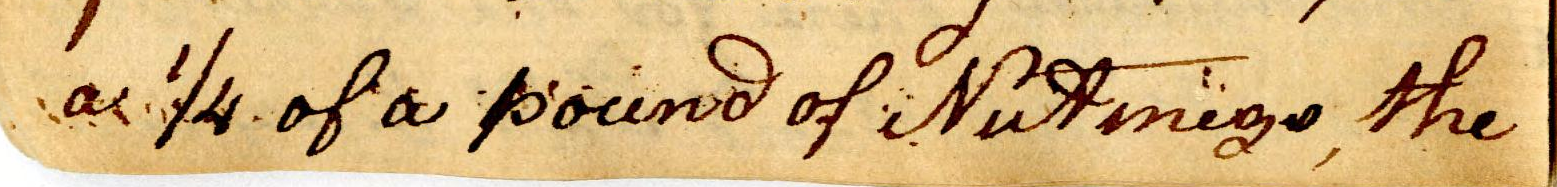a 1/4 of a pound of Nutmegs, the
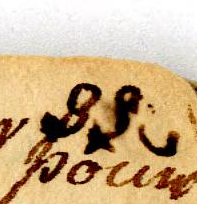33
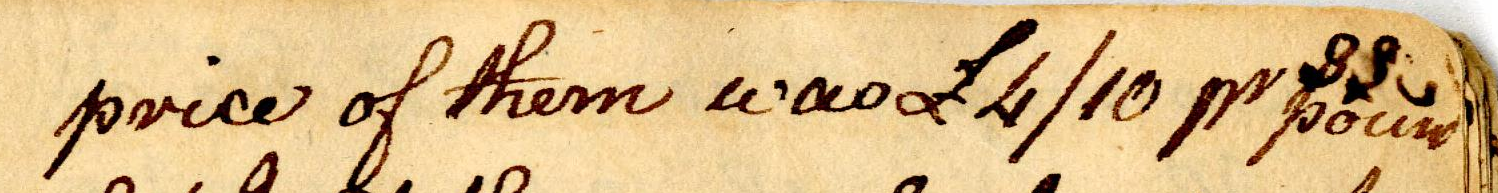price of them was £4s10 p^r pound
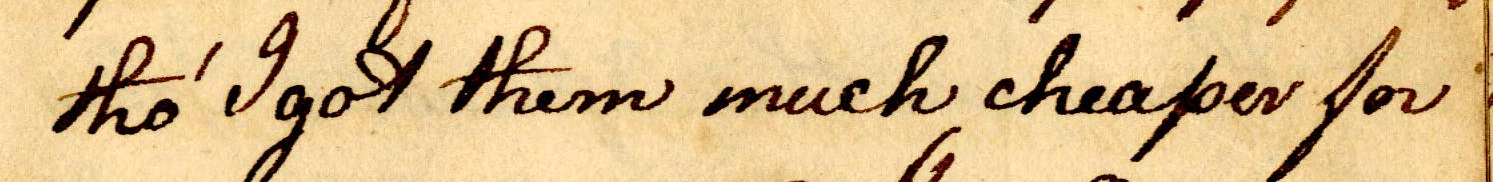tho' I got them much cheaper for
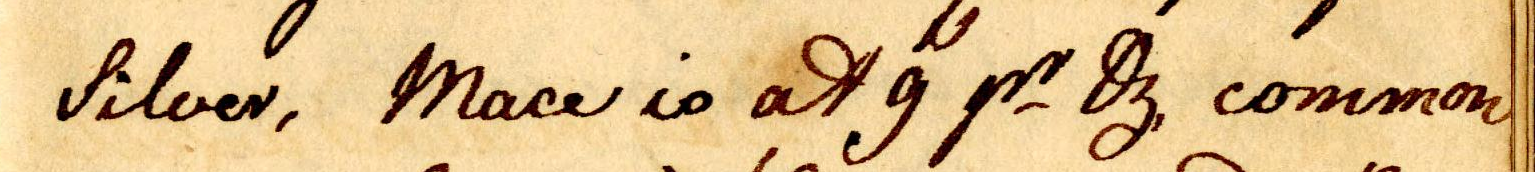Silver, Mace is at 9^6 p^r Oz, common
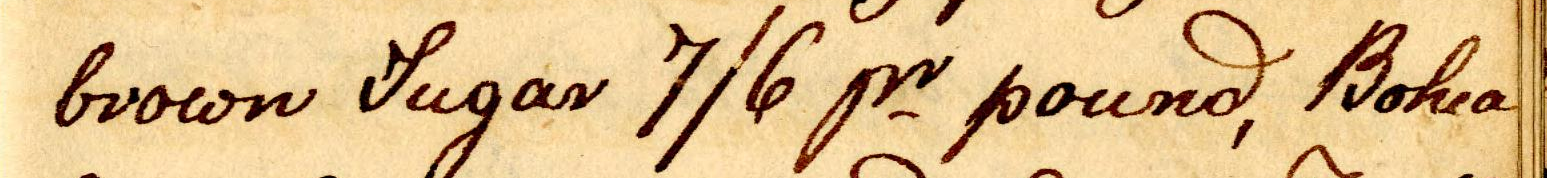brown Sugar 7s6 p^r pound, Bohea
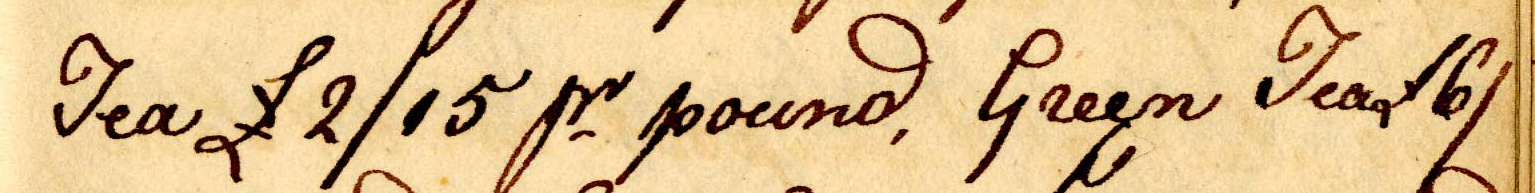Tea £2s15 per pound, Green Tea 16s
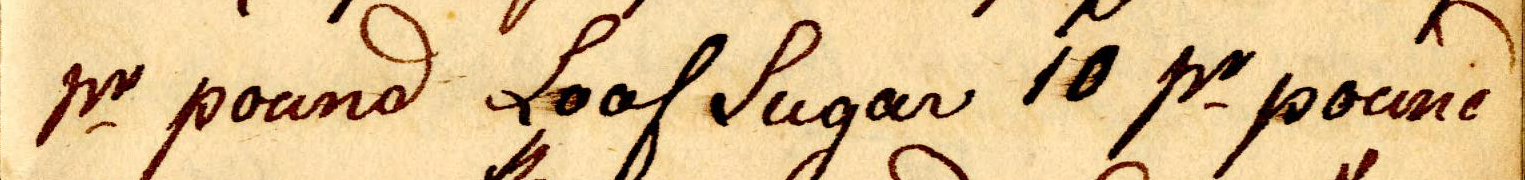per pound Loaf Sugar 10^6 p^r pound
